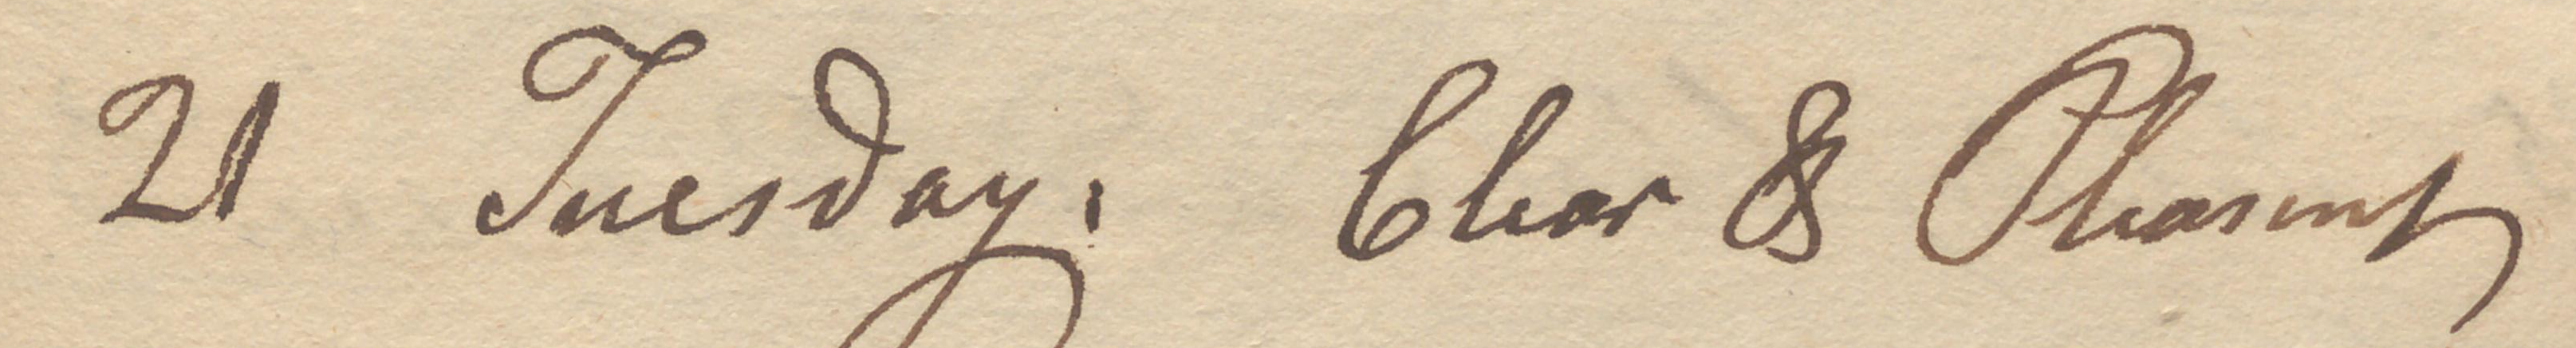21 Tuesday. Clear & Pleasent
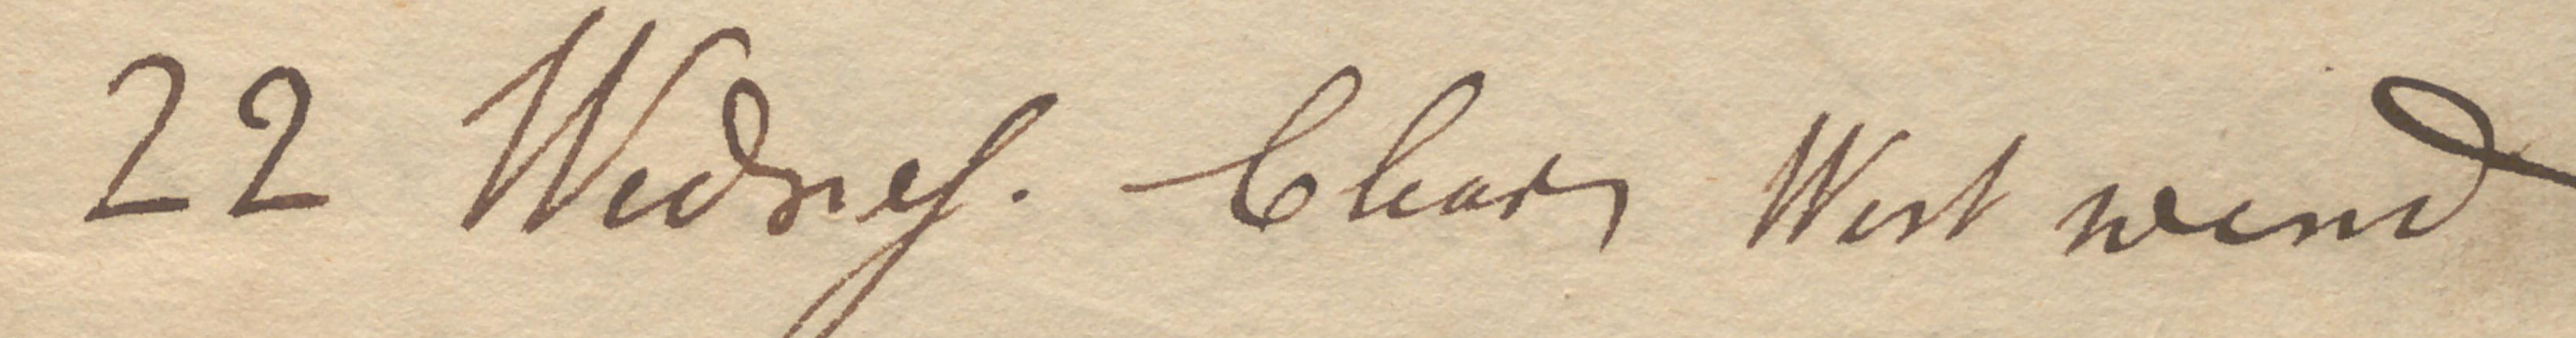22 Wednes. Clear West wind
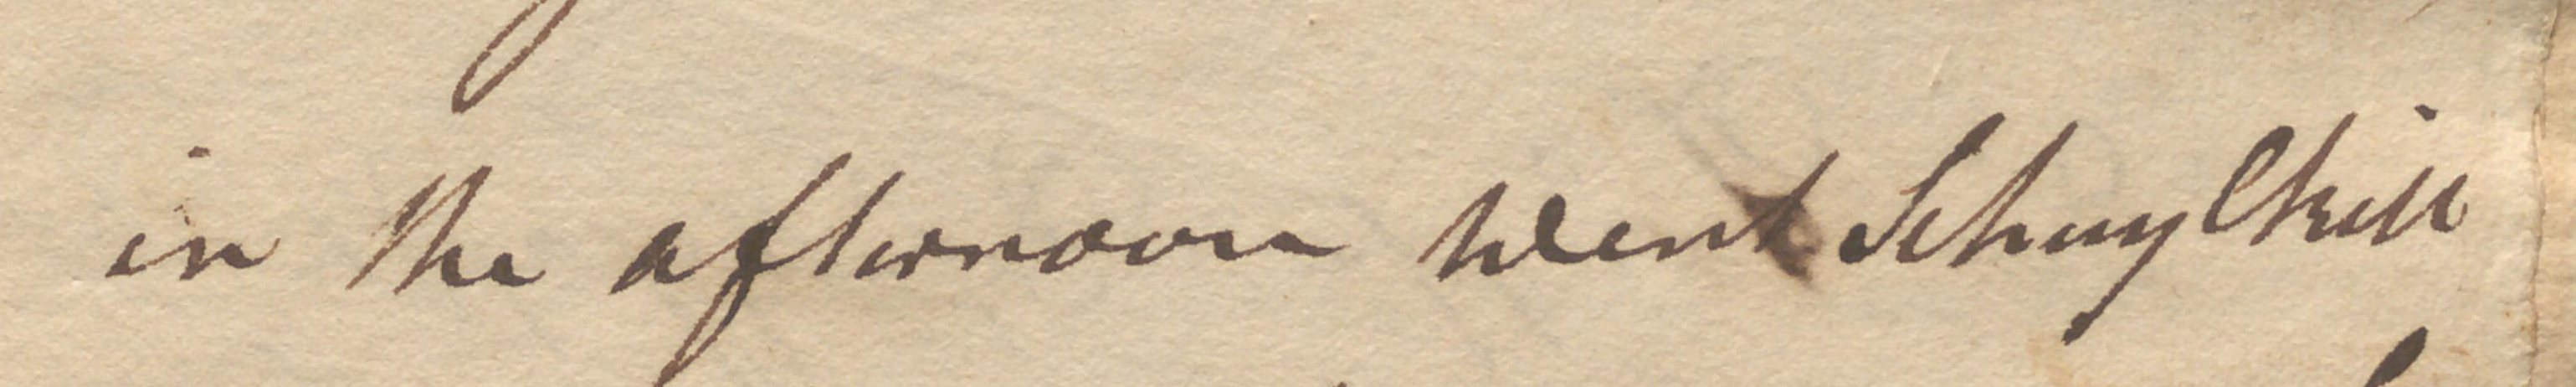in the afternoon went Schuylkill
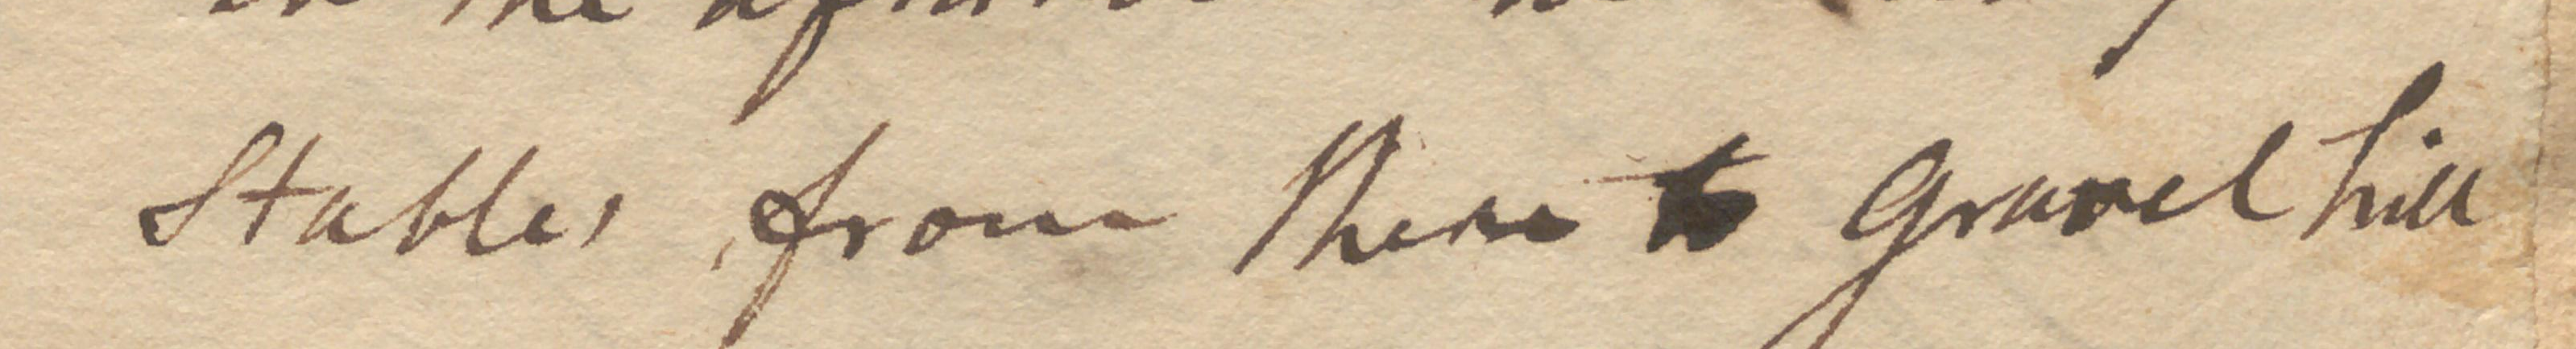Stables from there to Gravel hill
